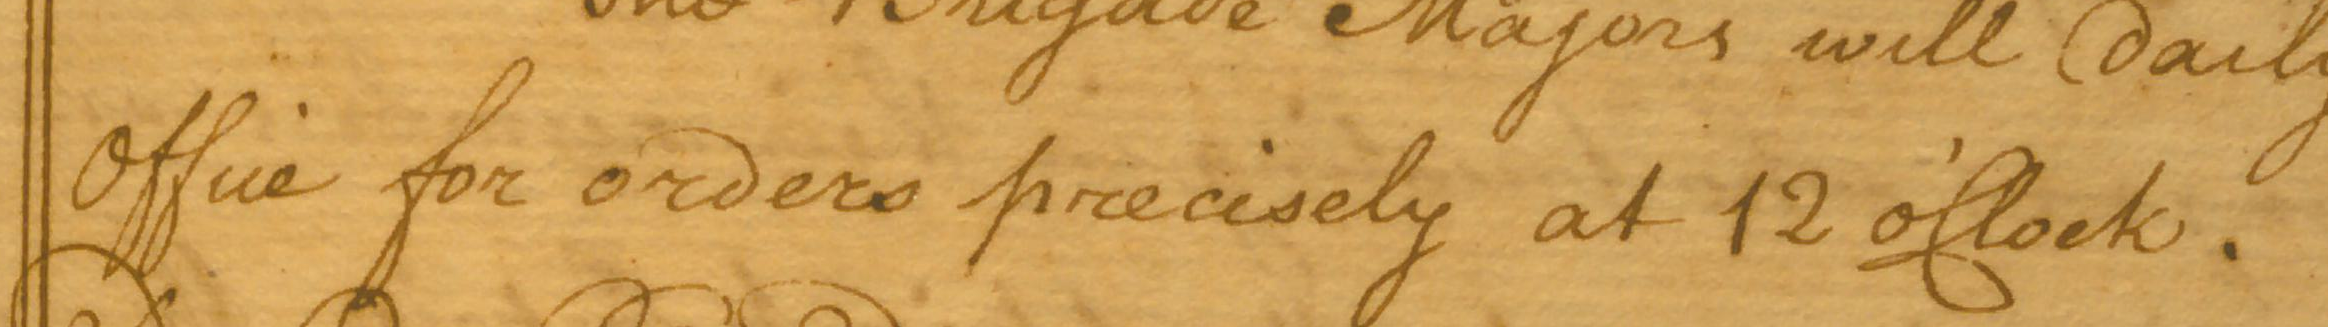Office for orders precisely at 12 o'Clock.
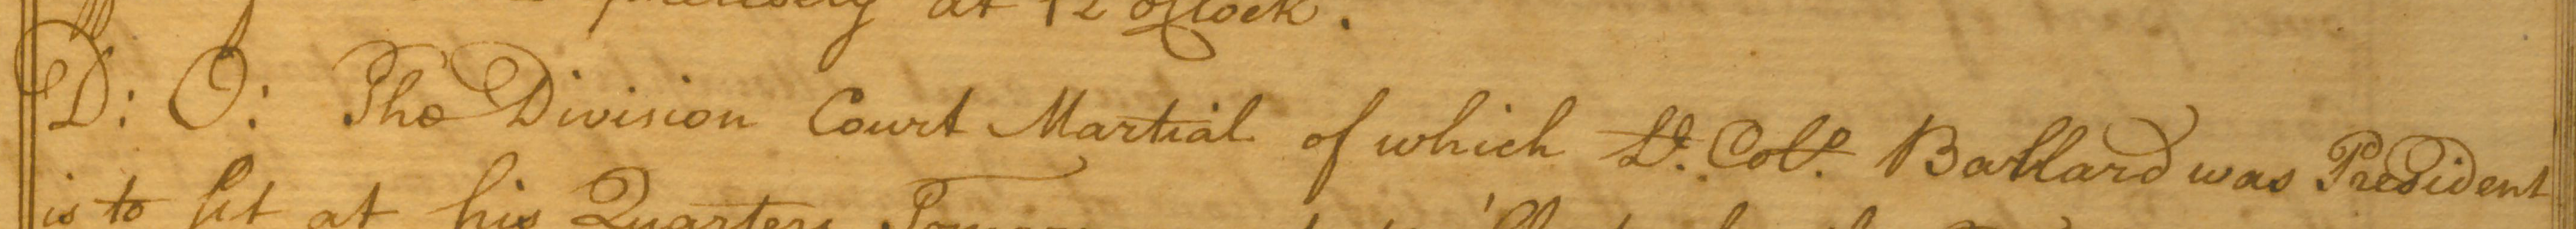D: O: The Division Court Martial of which L^t. Col^o. Ballard was President
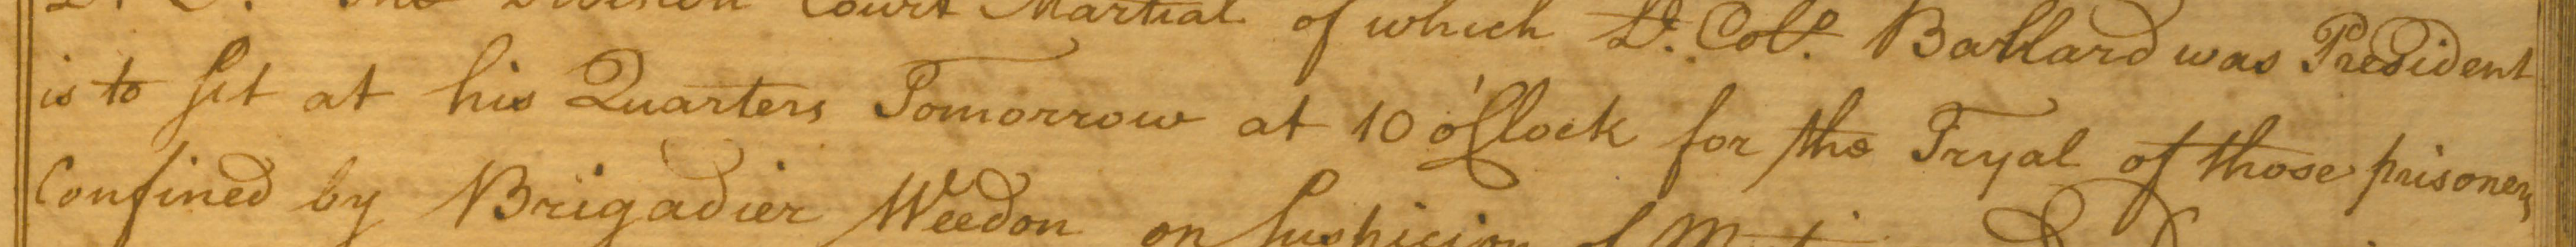is to sit at his Quarters Tomorrow at 10 o'Clock for the Tryal of those prisoners
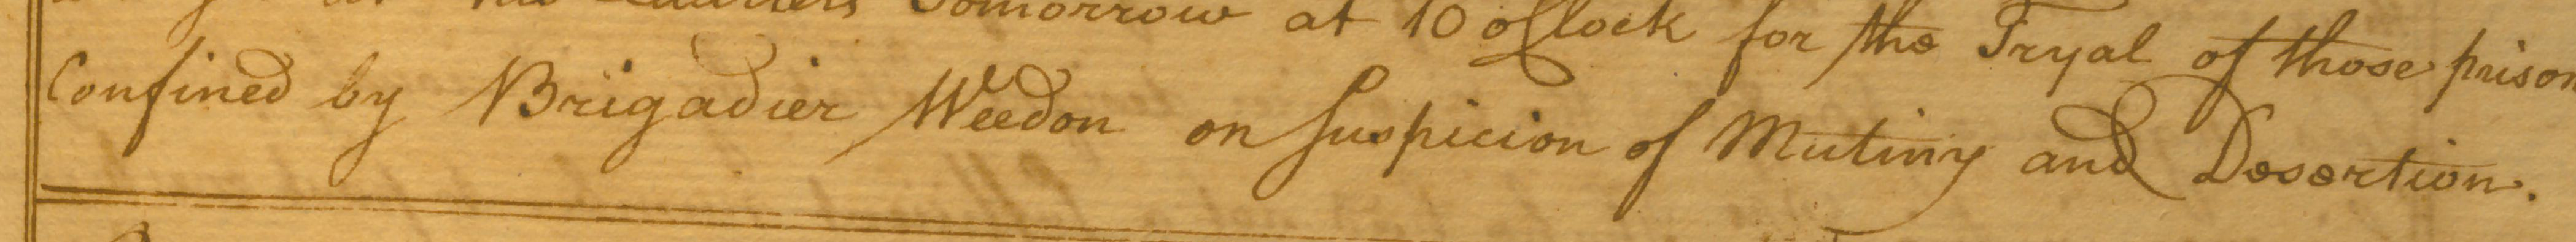Confined by Brigadier Weedon on Suspicion of Mutiny and Desertion.
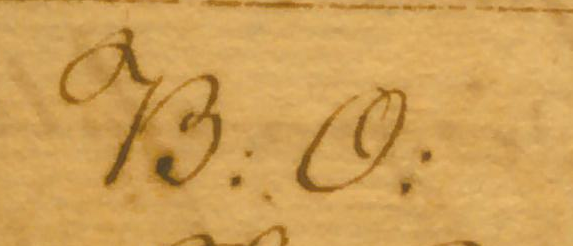B: O:
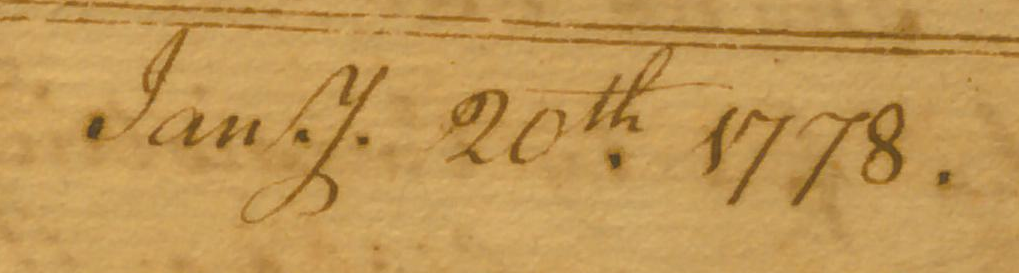Jan^y. 20^th. 1778.
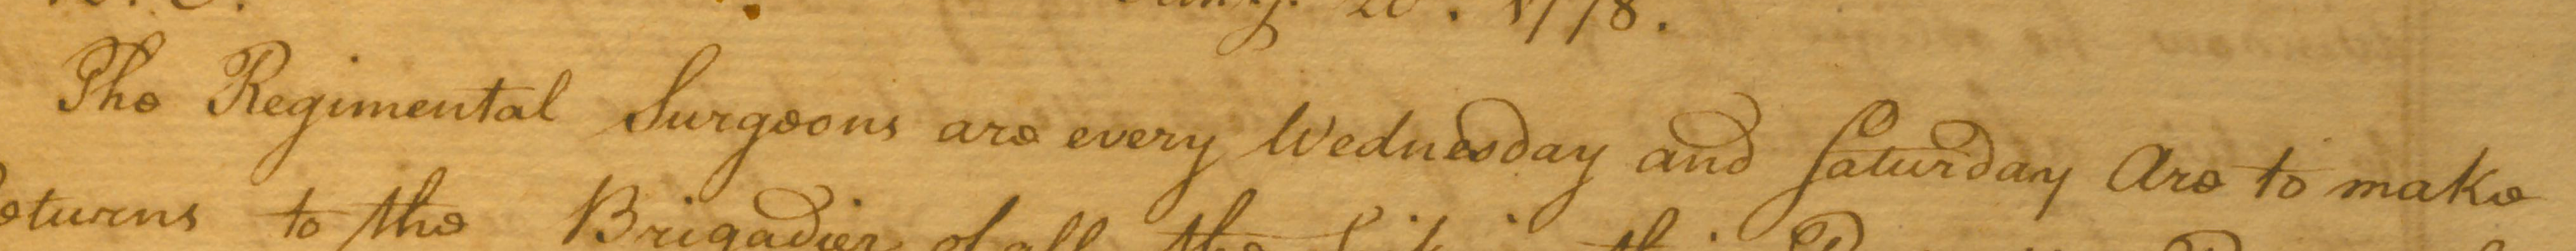The Regimental Surgeons are every Wednesday and Saturday are to make
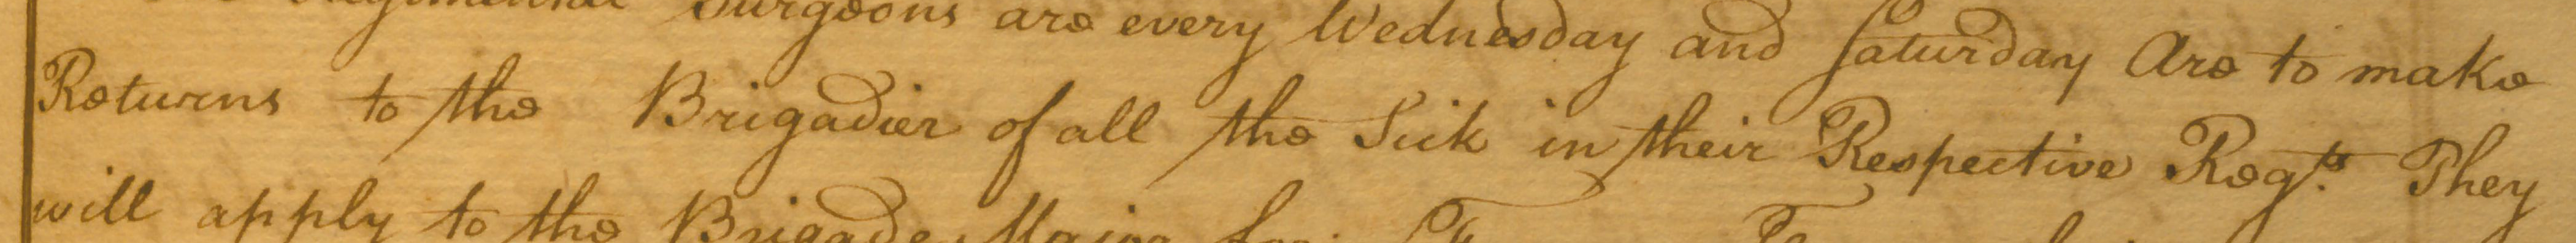Returns to the Brigadier of all the Sick in their Respective Reg^ts. They
